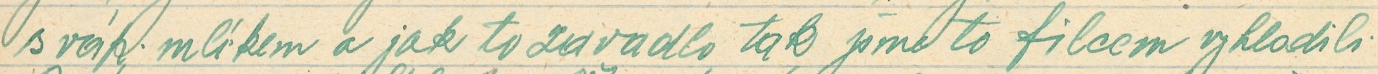s váp. mlékem a jak to zavadlo tak jsme to filcem vyhladili.
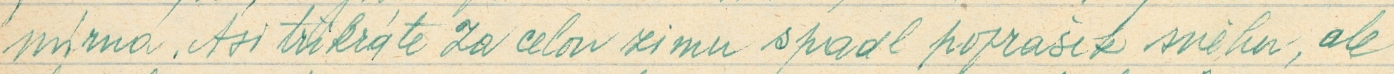mírná. Asi třikráte za celou zimu spadl poprašek sněhu, ale
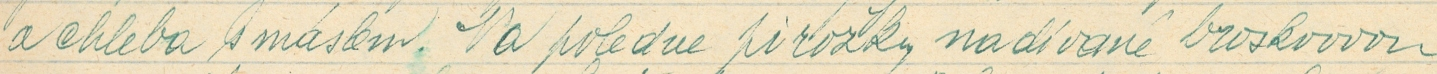a chleba s máslem. Na poledne pirožky nadívané broskvovou
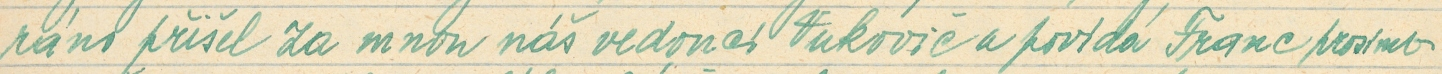ráno přišel za mnou náš vedoucí Vukovič a povídá Franc prosímtě
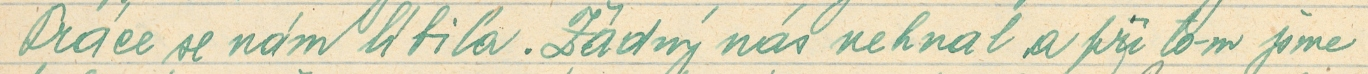Práce se nám líbila. Žádný nás nehnal a při tom jsme
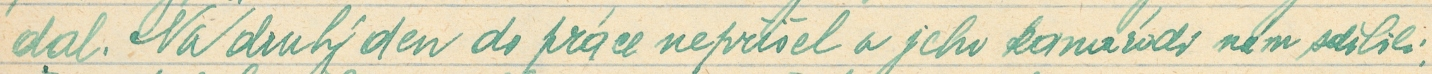dal. Na druhý den do práce nepřišel a jeho kamarádi nám sdělili,
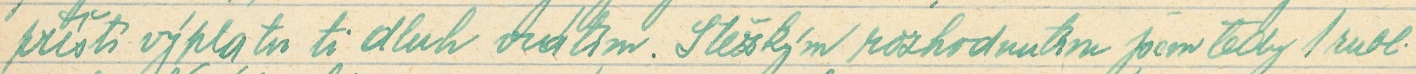příští výplatu ti dluh vrátím. S težkým rozhodnutím jsem tedy 1 rubl
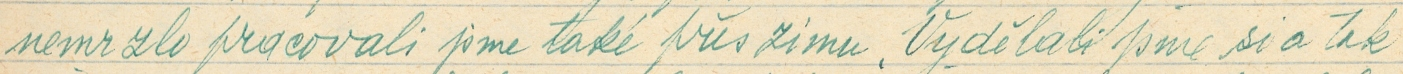nemrzlo pracovali jsme také přes zimu. Vydělali jsme si a tak
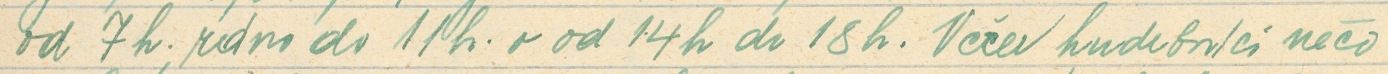od 7 h. ráno do 11 h. od 14 h do 18 h. Večer hudebníci něco
